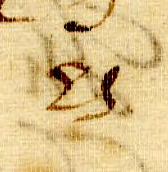ES
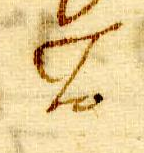To
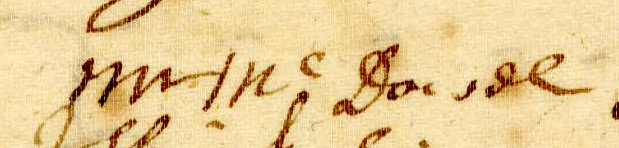M^r M^c Dewel
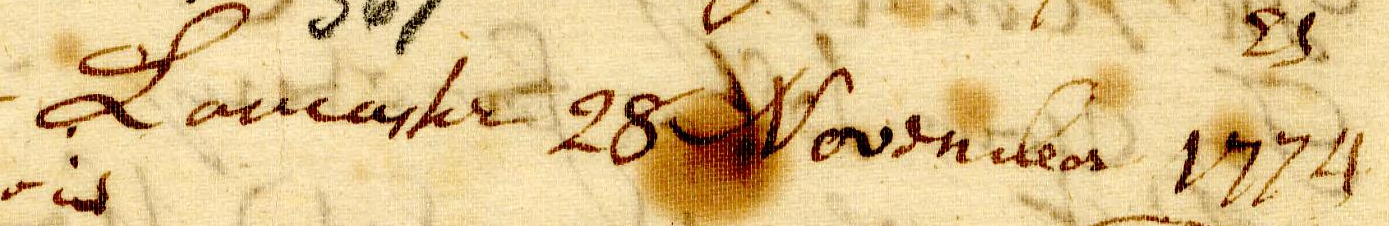Lancaster 28 November 1774
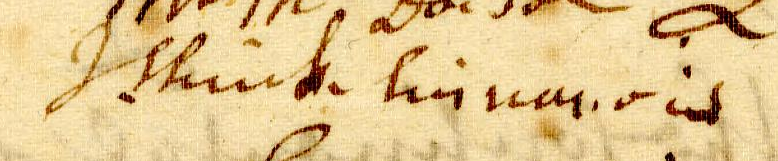I think his name is
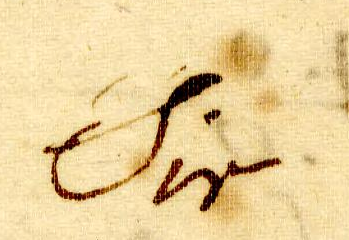Sir
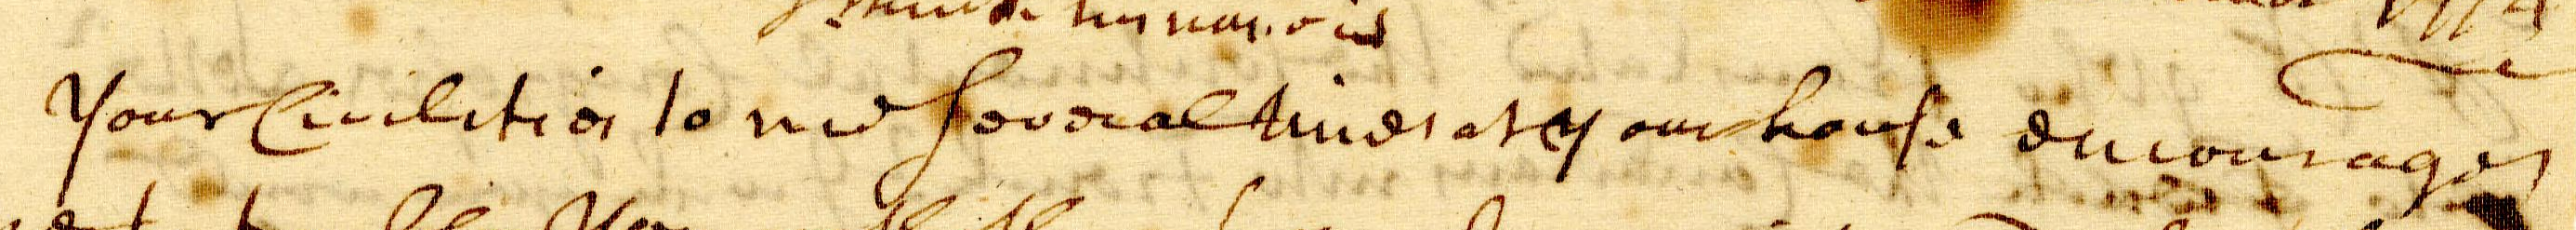Your Civilities to me Several tines at your house encourages
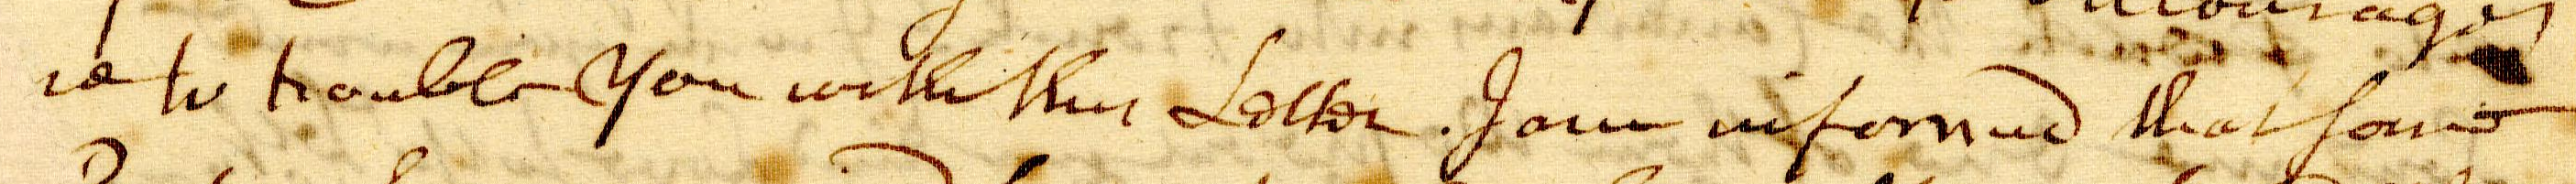me to trouble You with this Lotter. I am informed that some
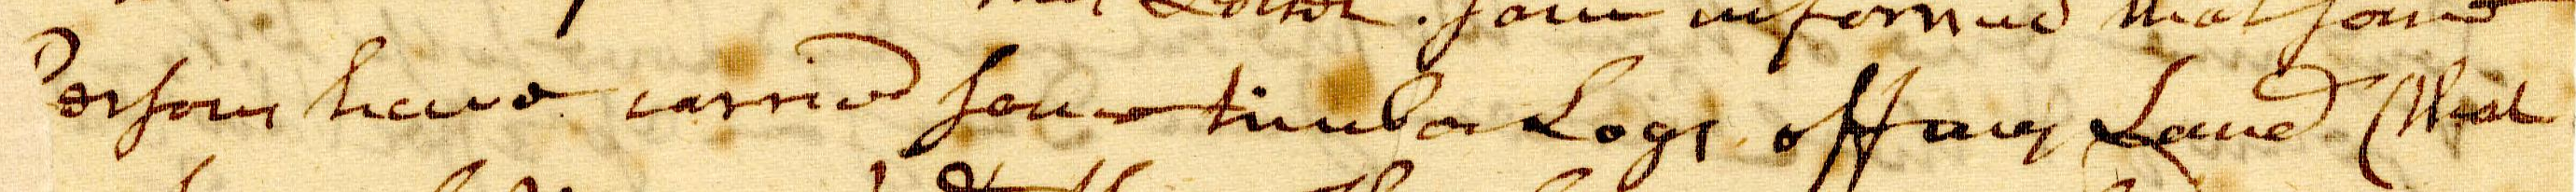Persons have carried four timber Logs off my Land (that
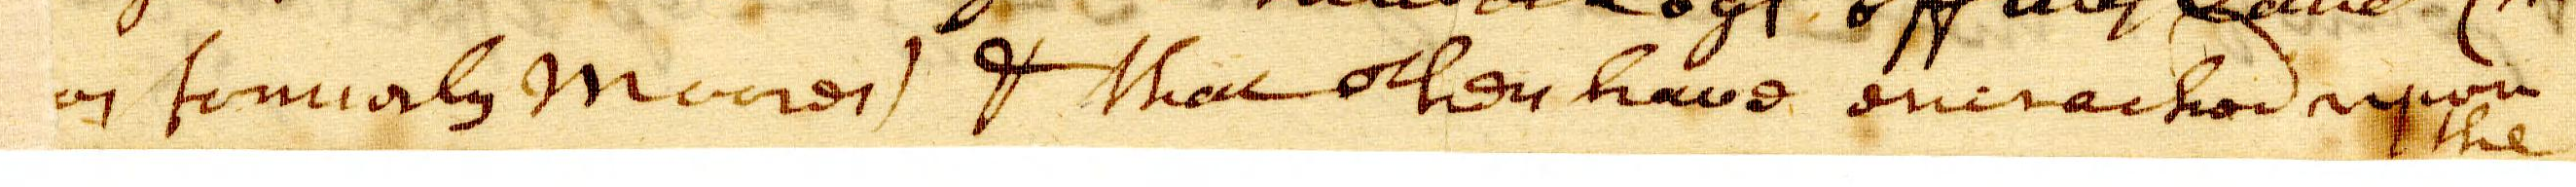is formerly Meases) & that others have encroached upon
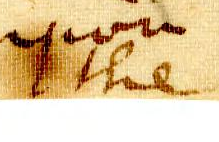the
